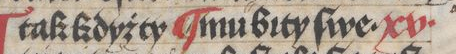tak kdyż ty mu bity ſwe.xv.
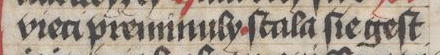vieci preminuly.ſtala ſie geſt
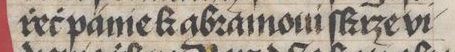ṙeċ panie k abramoui ſkrze vi¬
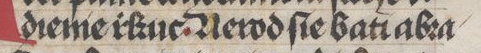dieníe ṙkuc.Nerod ſie bati abra¬
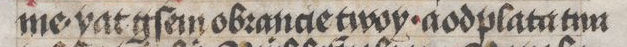me.yat gſem obrancie twoy.a odplata twa
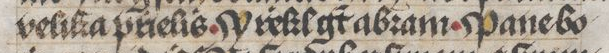welika pṙieliṡ.Y ṙekl ḡt abram.Pane bo¬
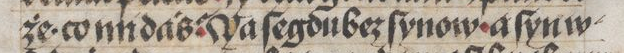że.co mi daṡ?Ya ſegdu bez ſynow.a ſyn w¬
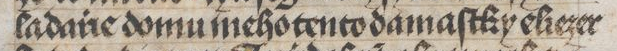ladaṙie domu meho tento damaſtky eliezer.
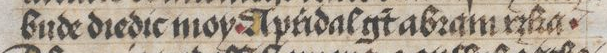bude diedic moy.A pṙidal ḡt abram rzka.
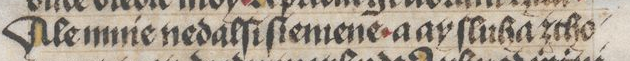Ale mnie nedalſi ſiemene.a ay ſluha zcho¬
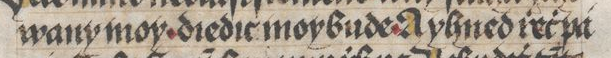wany moy.diedic moy bude.A yhned ṙeċ pa¬
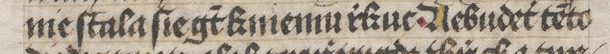nie ſtala ſie ḡt k niemu ṙkuc.Nebudeṫ tēto
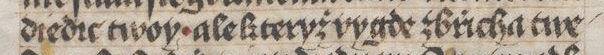diedic twoy.ale kteryž vygde zbṙicha twe¬
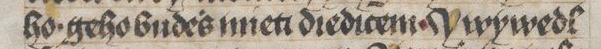ho.geho budeṡ mieti diedicem.Y wywedl
